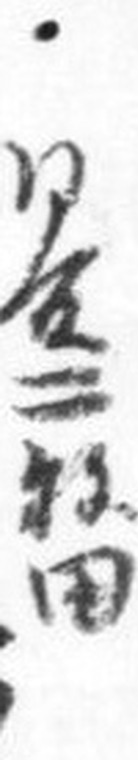同所二枚田
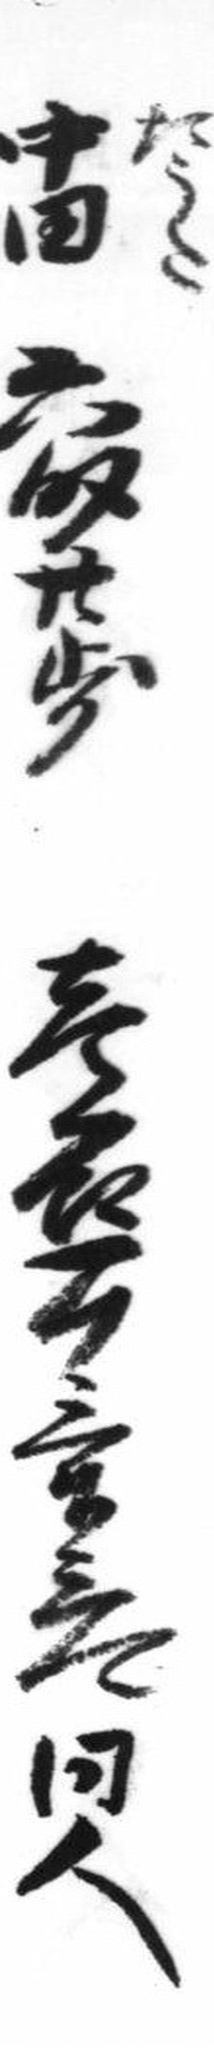中田六畝廿歩壱石一斗三升三合同人
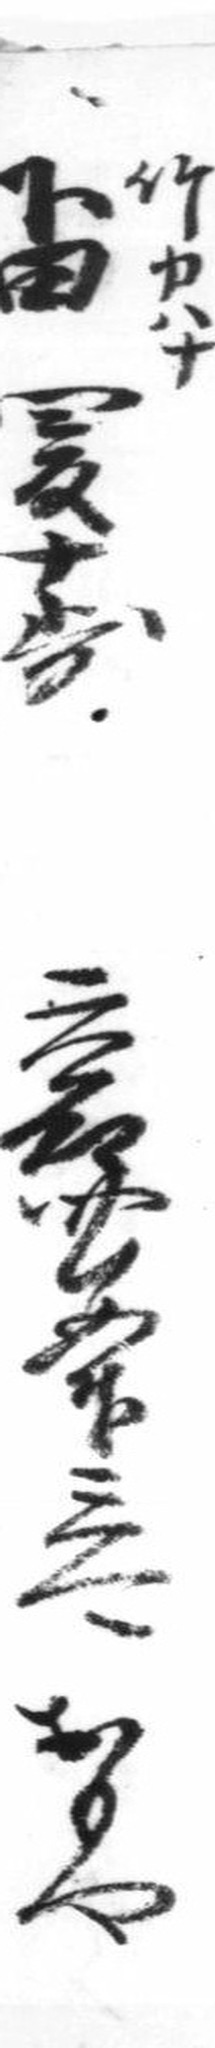下田四反十歩六石四斗五升三合出〆や
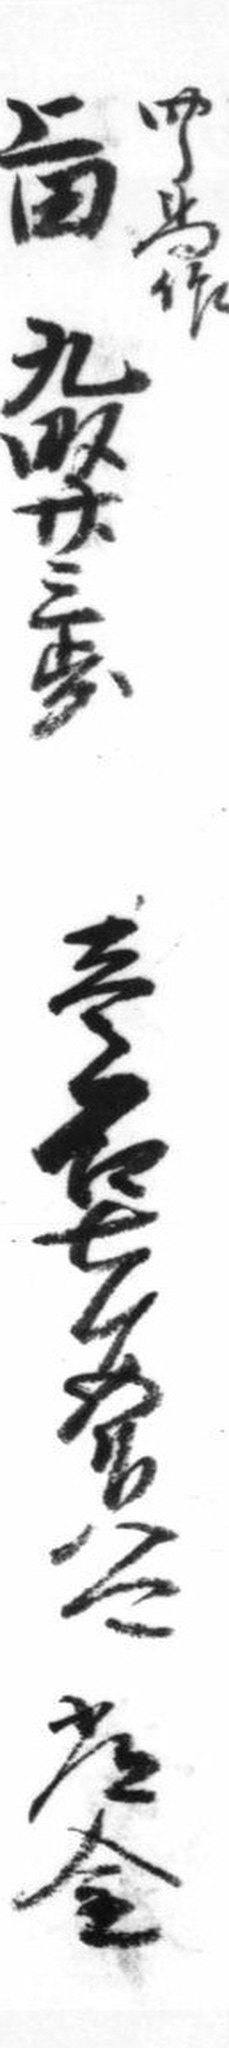上田九畝廿三歩壱石七斗五升八合常念

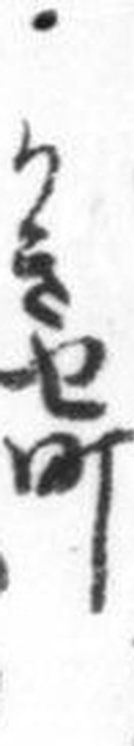かきせ町
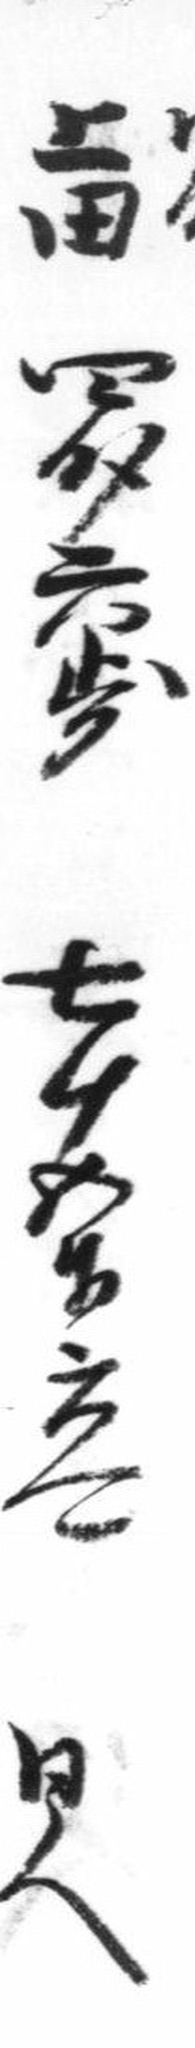上田四畝六歩七斗五升六合同人
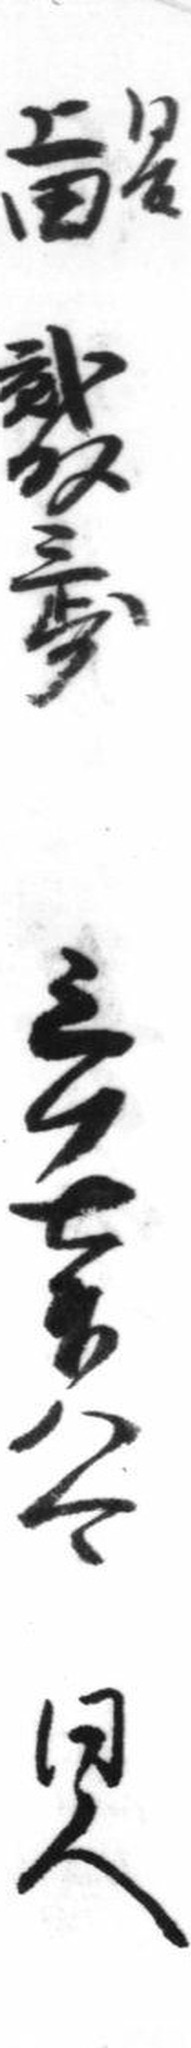上田弐畝三歩三斗七升八合同人
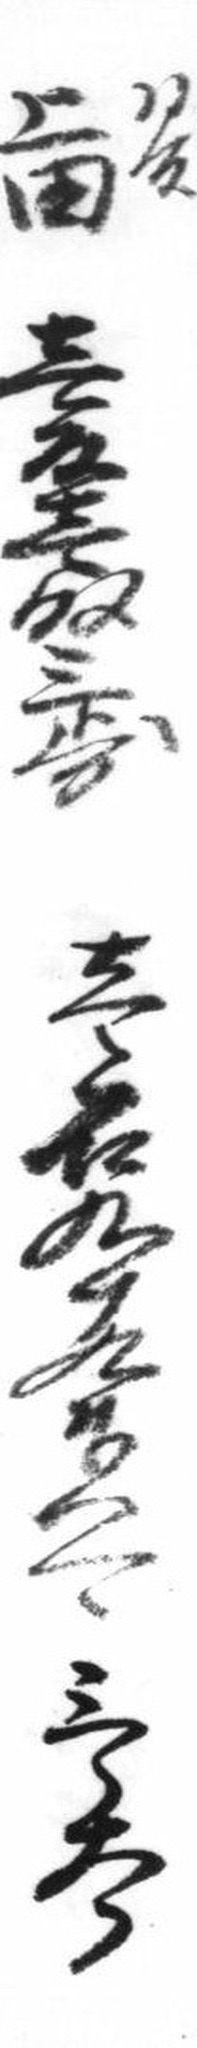上田壱反壱畝三歩壱石九斗九升八合三郎太郎
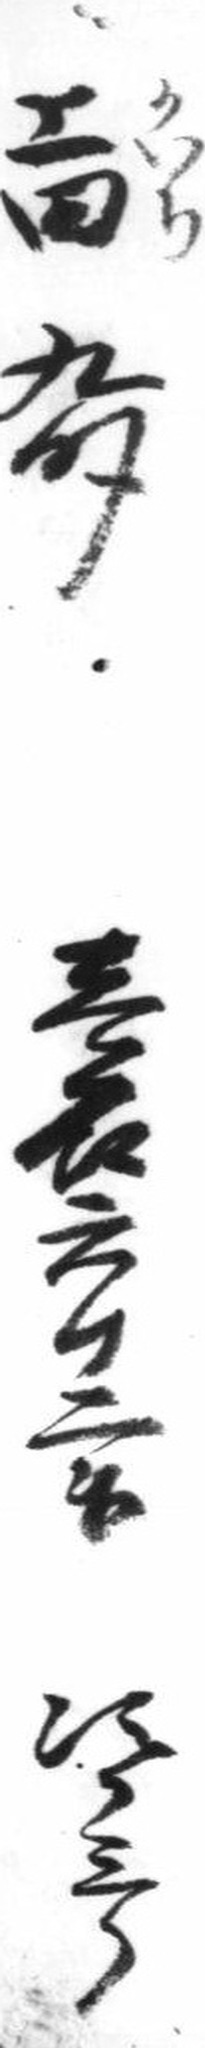上田九畝壱石六斗二升次郎三郎
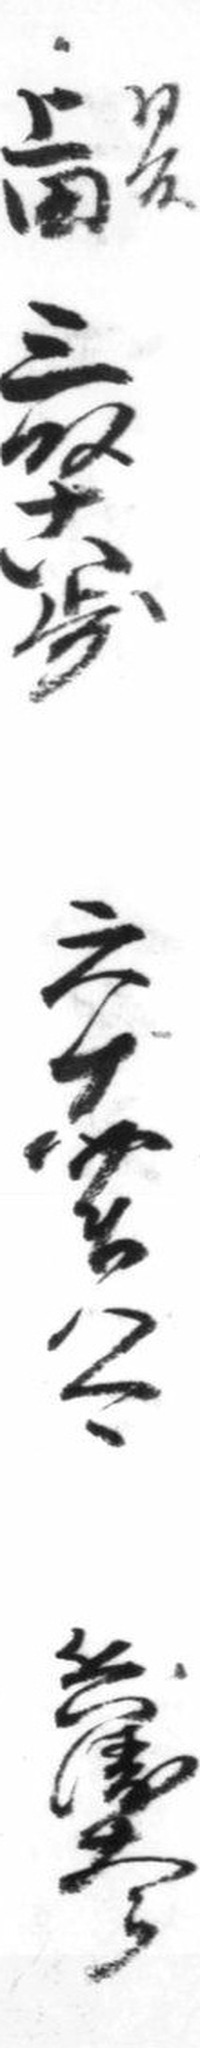上田三畝十八歩六斗四升八合兵衛太郎
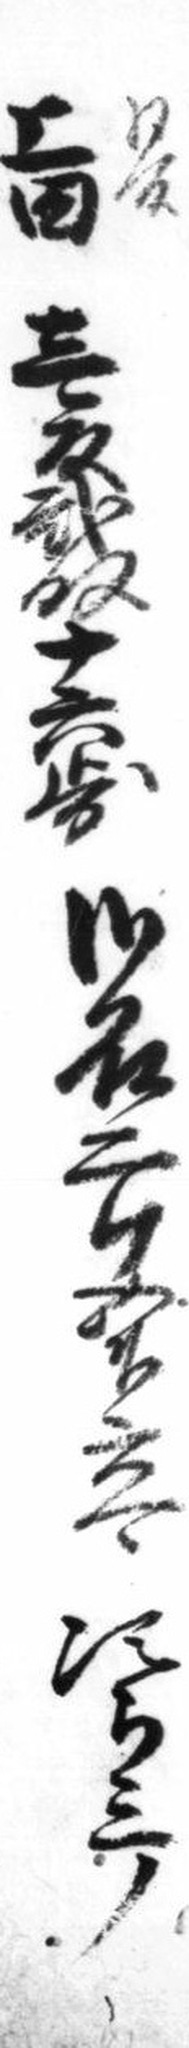上田壱反弐畝十六歩弐石二斗五升六合次郎三郎
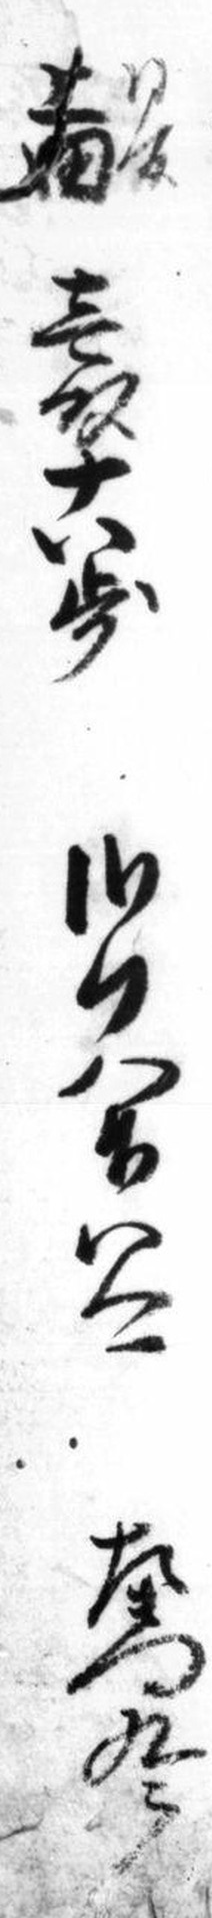上田壱畝十八歩弐斗八升八合左衛門九郎

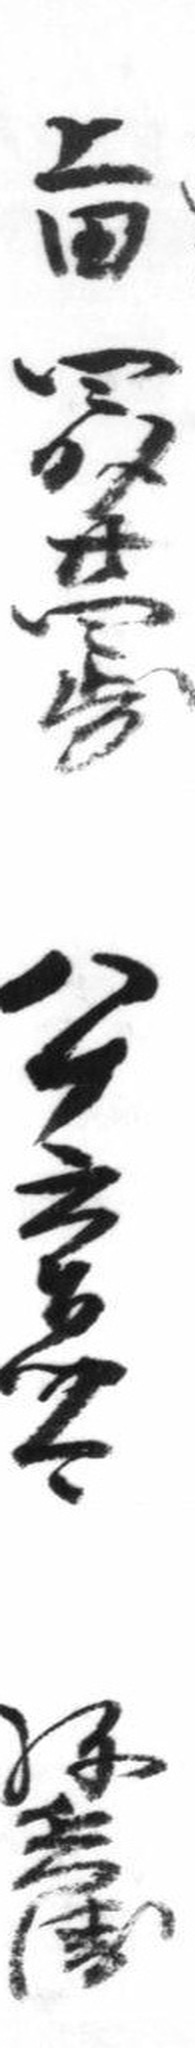上田四畝廿四歩八斗六升四合孫兵衛
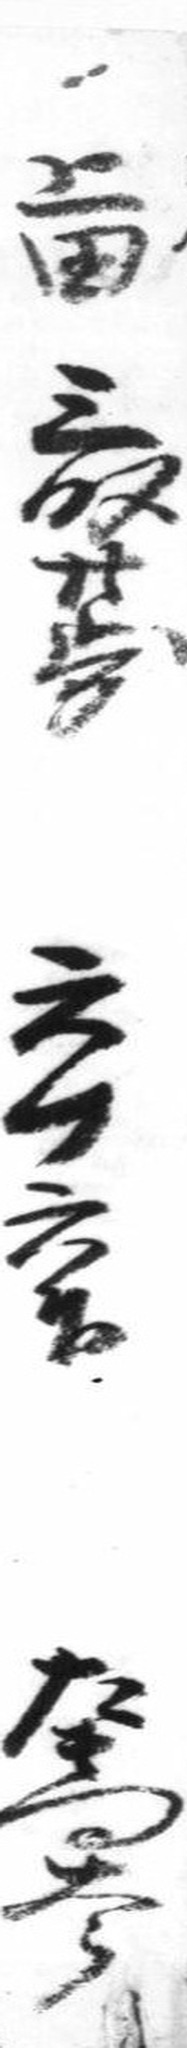上田三畝廿歩六斗六升左衛門太郎
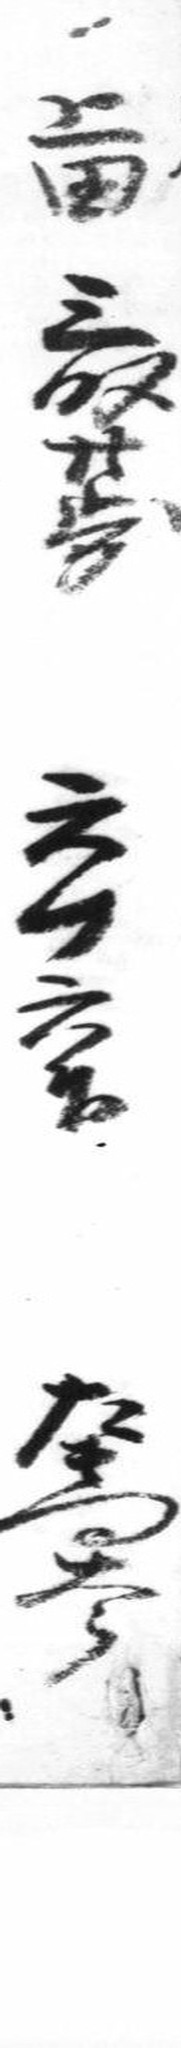上田三畝廿歩六斗六升左衛門太郎
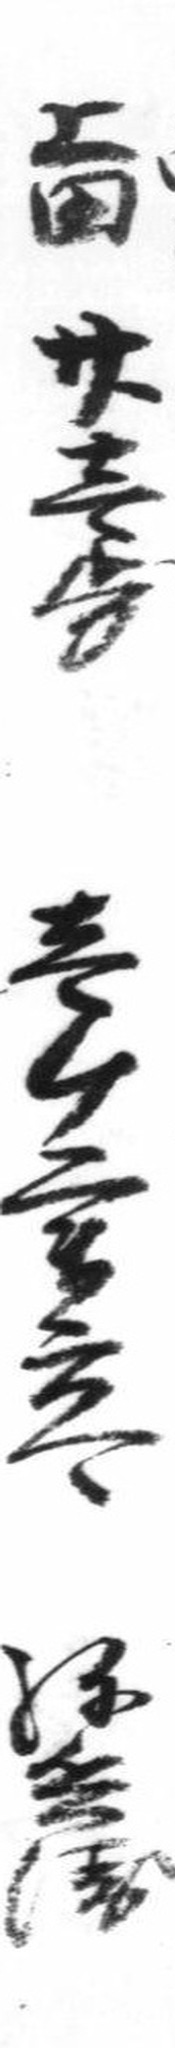上田廿壱歩壱斗二升六合孫兵衛
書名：越前国大野郡今井村御検地帳
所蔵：福井県文書館 Fukui Prefectural Archives
